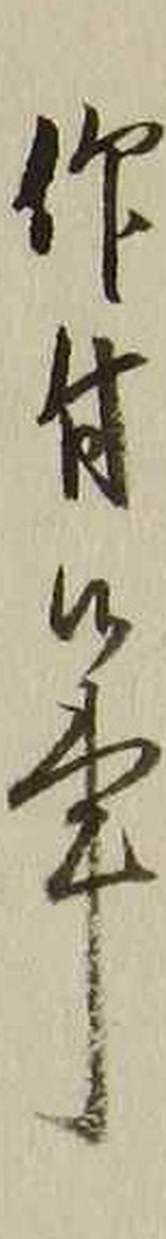仰付候事
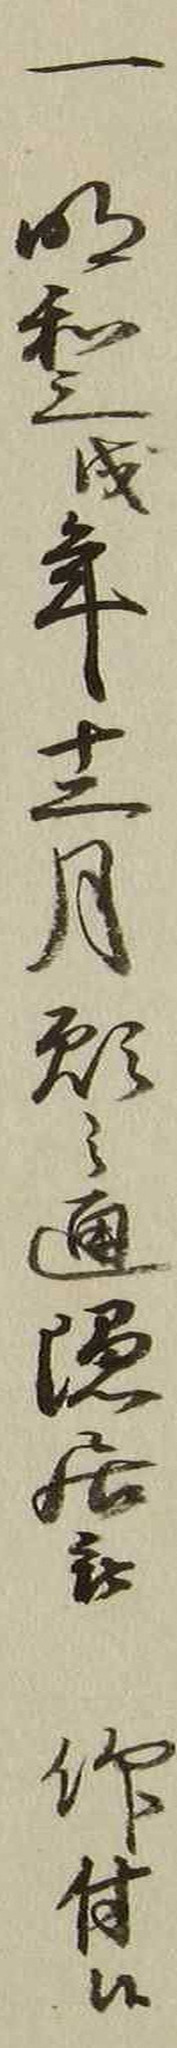一明和三戌年十二月願之通隠居被仰付候
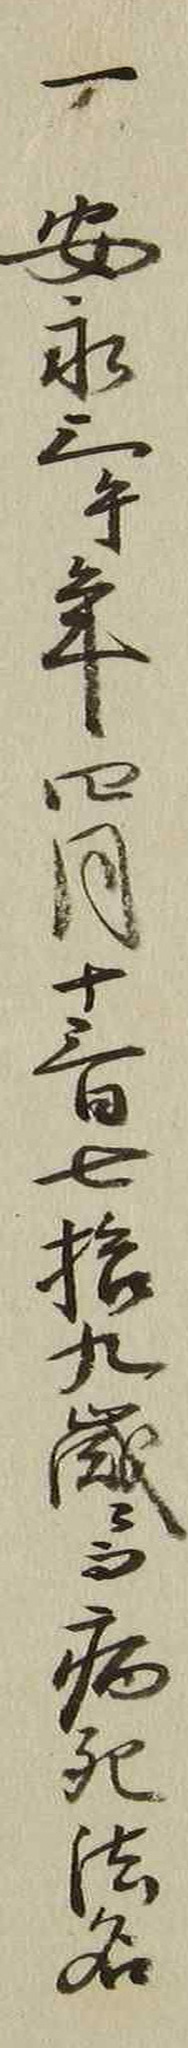一安永三午年四月十三日七拾九歳ニ而病死法名
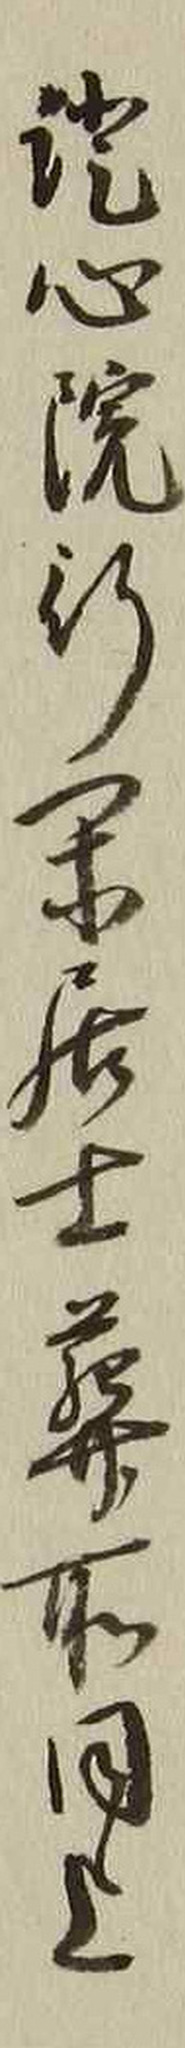証心院行閑居士葬所同上
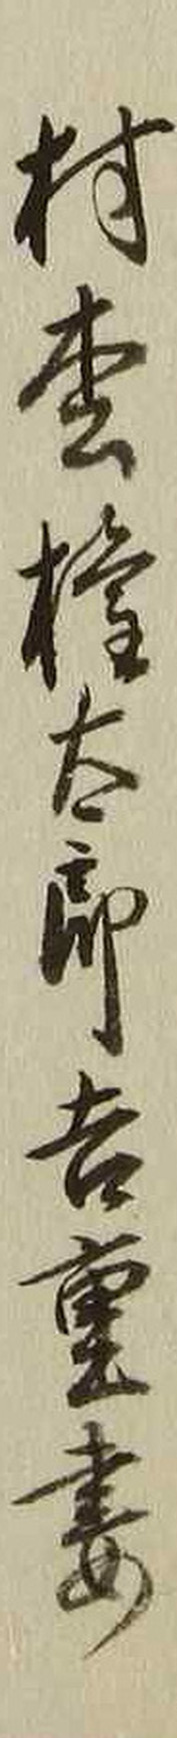女村松権太郎吉重妻
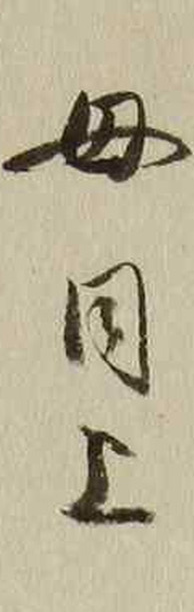母同上
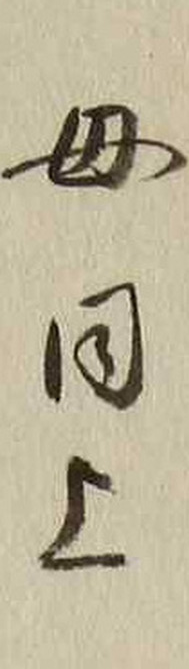母同上
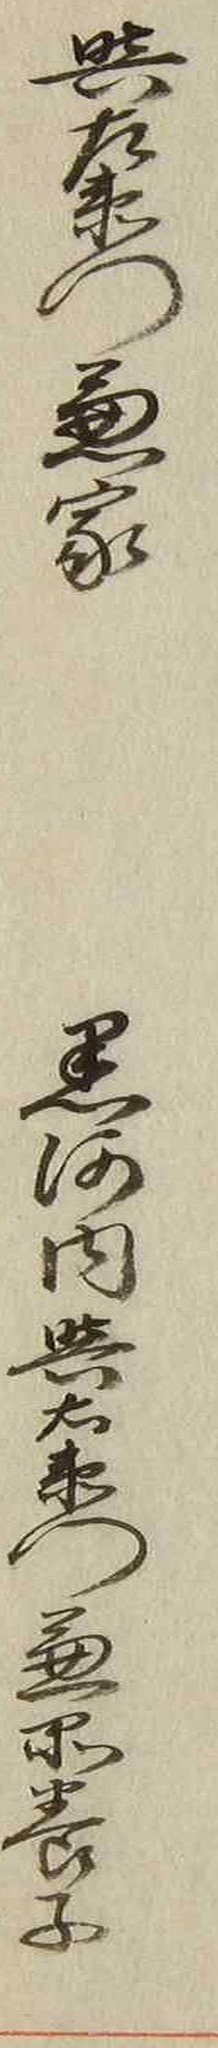与左衛門兼家黒河内与右衛門兼品養子
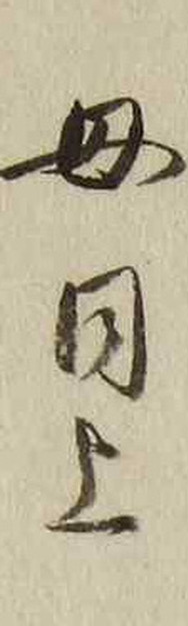母同上
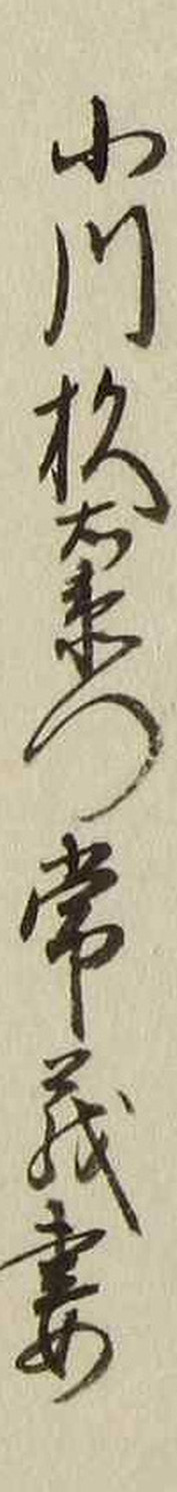女小川杉右衛門常義妻
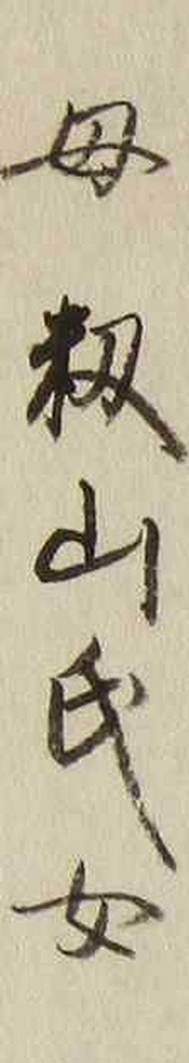母籾山氏女

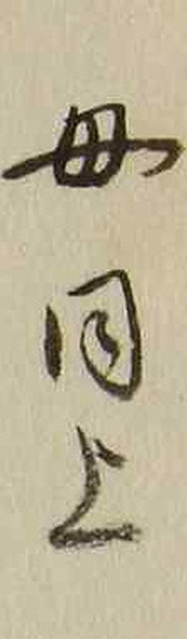母同上
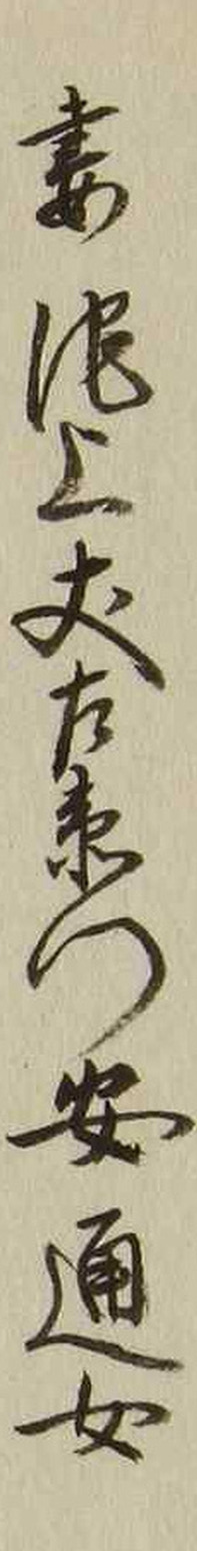妻池上丈左衛門安通女
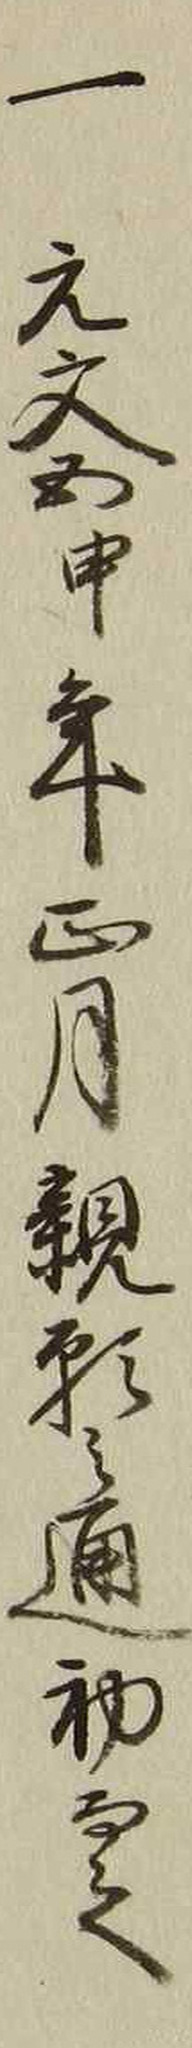一元文五申年正月親願之通初而之
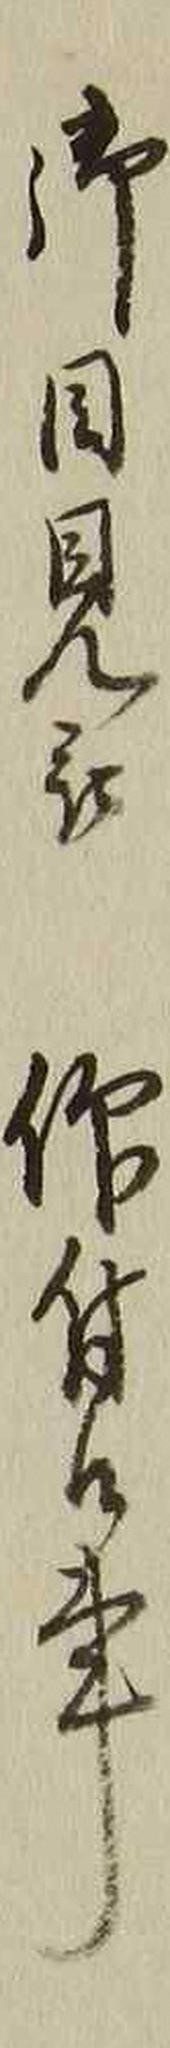御目見被仰付候事
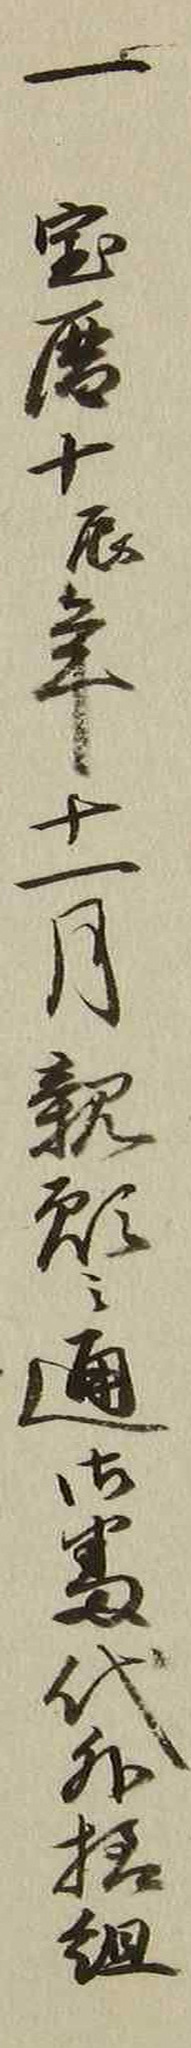一宝暦十辰年十一月親願之通御番代外様組
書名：諸士系譜　巻之128　た之部4
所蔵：会津若松市立会津図書館
